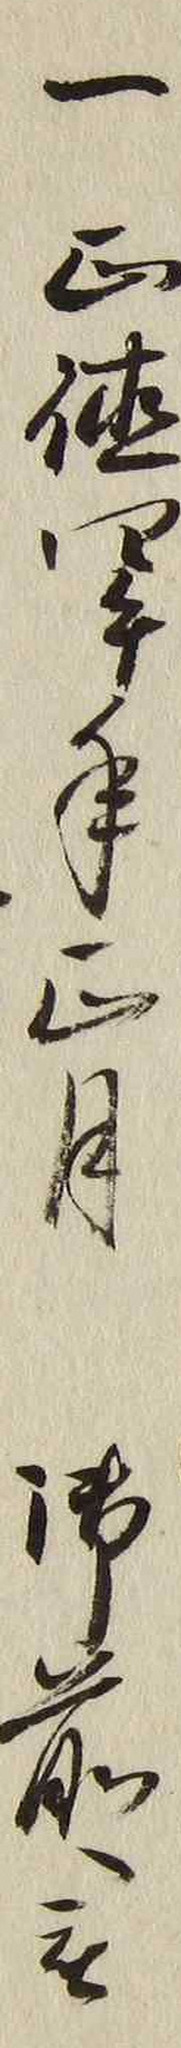一正徳四午年正月御前へ被
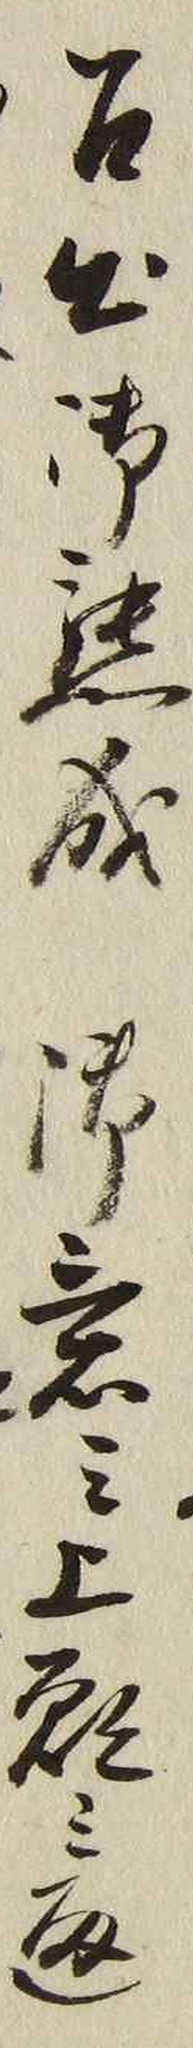召出御熊成御意之上願之通

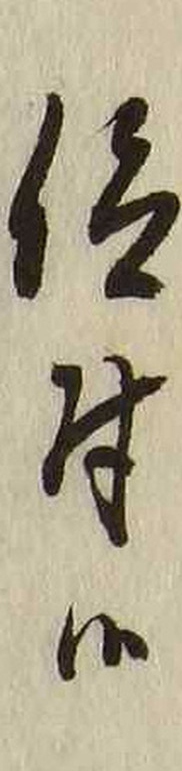仰付候
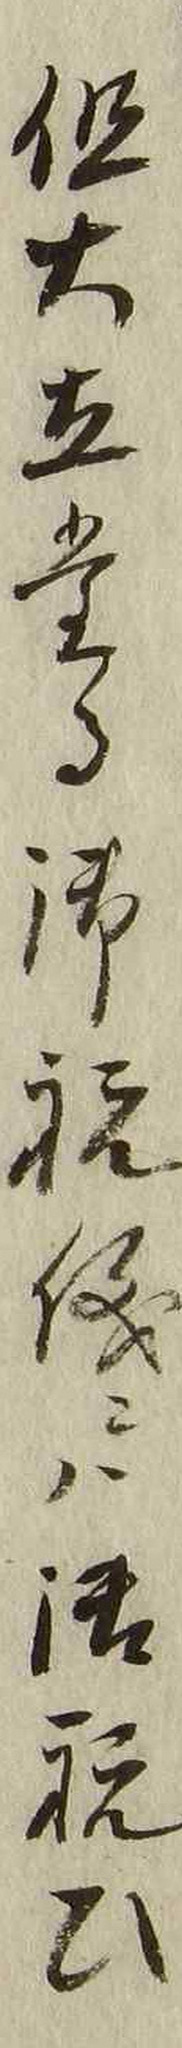但大立たる御祝儀ニハ活祝ひ
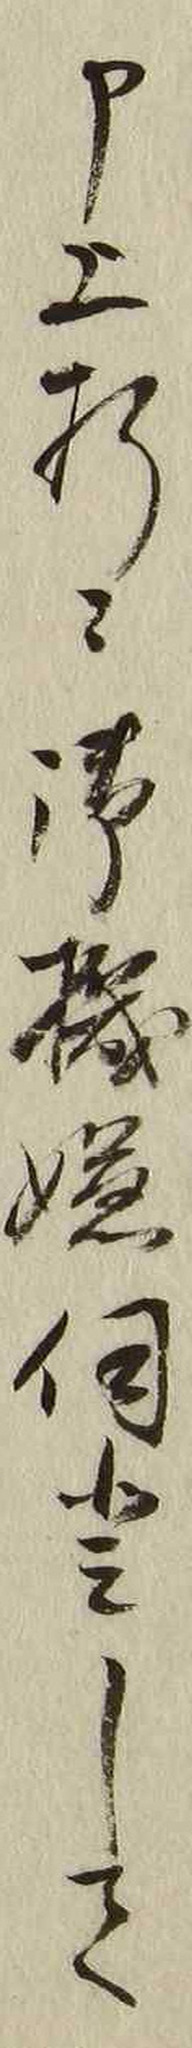申上折々御機嫌伺として
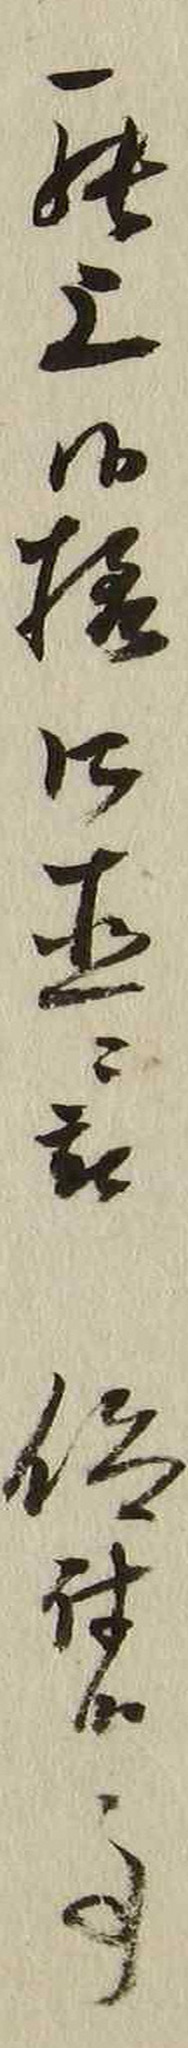罷上候様御直ニ被仰付候事
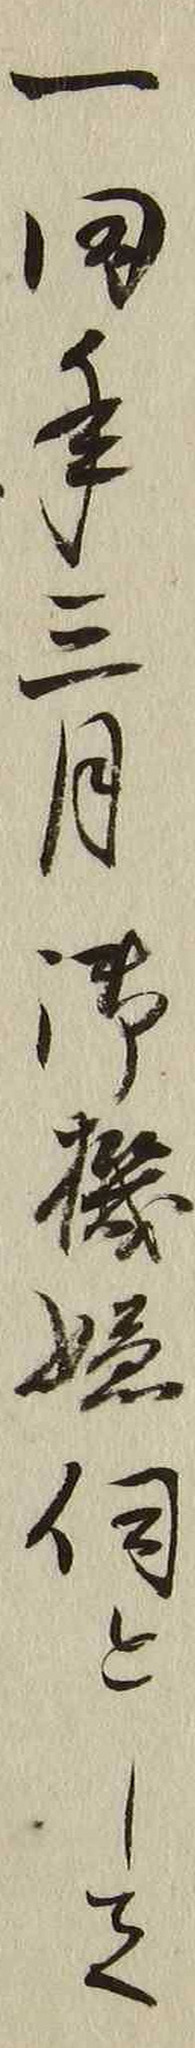一同年三月御機嫌伺として
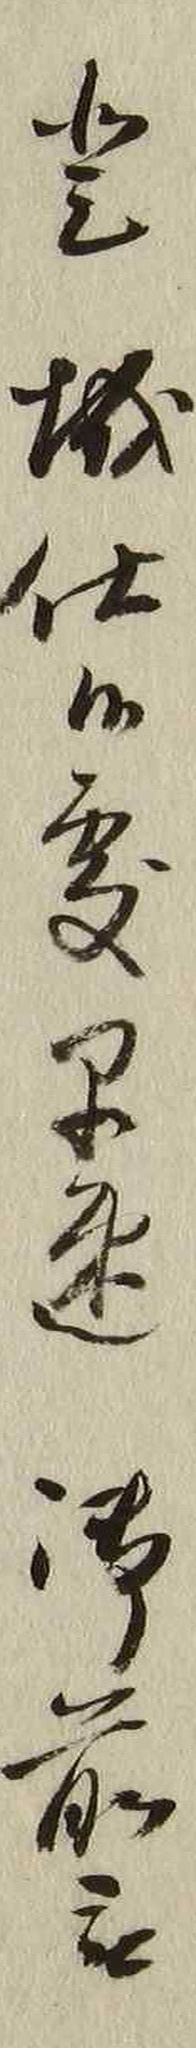登城仕候処早速御前被
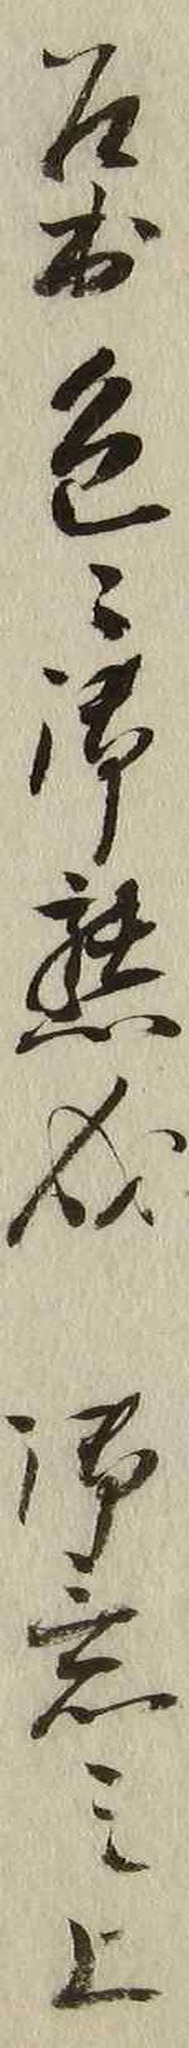召出色々御熊成御意之上
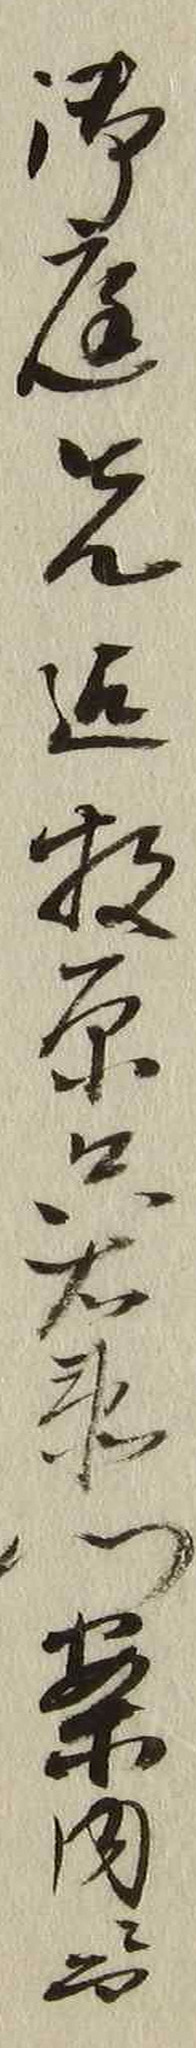御庭先迄牧原只右衛門案内ニ而
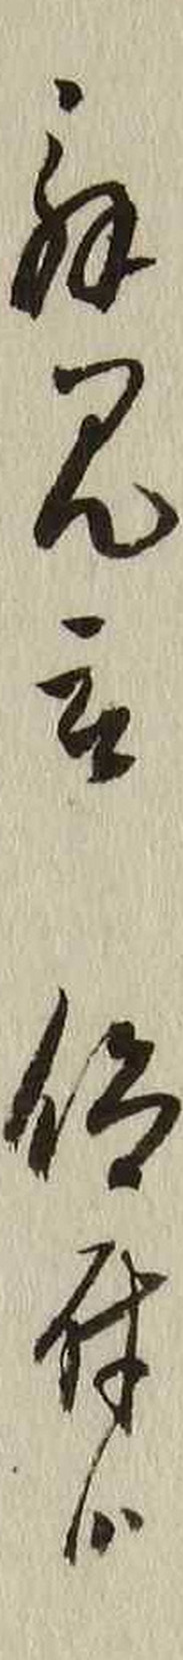拝見被仰付候
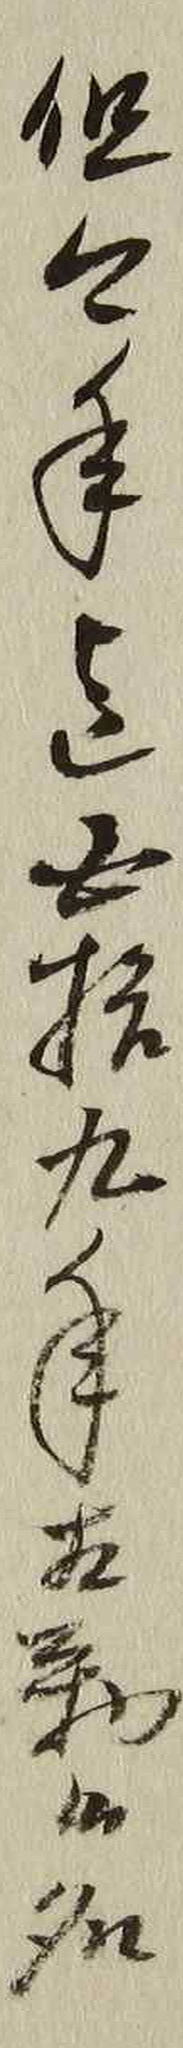但今手迄五拾九年相勤候処
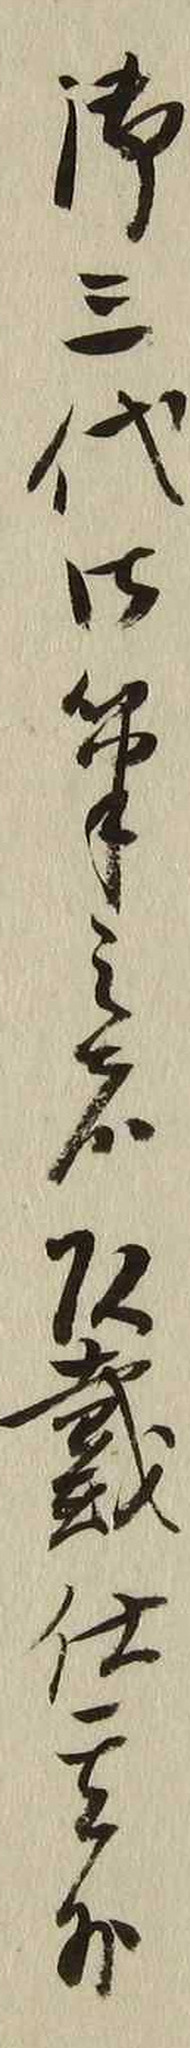御三代御筆之者頂戴仕其外
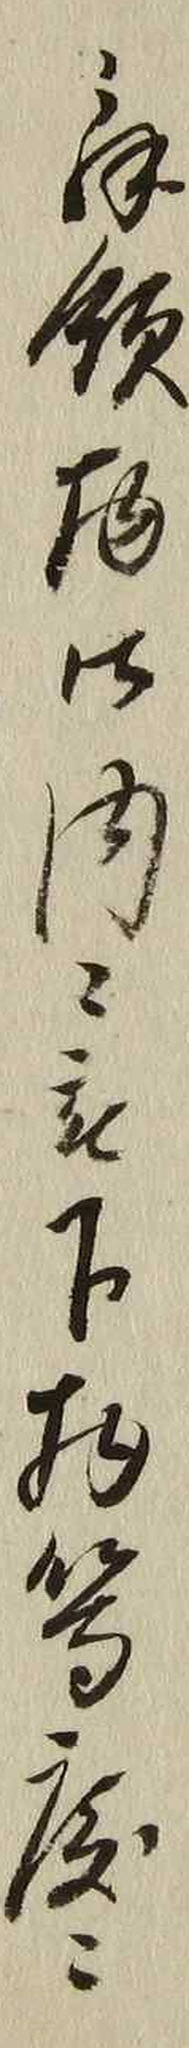拝領物御内々被下物等度々
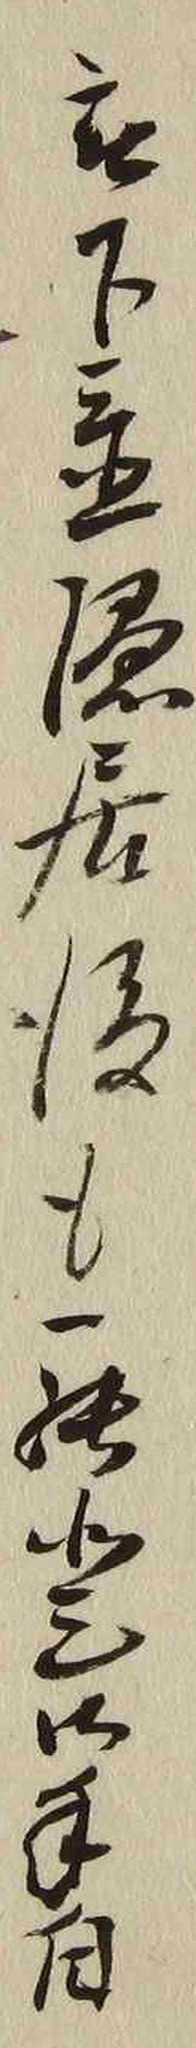被下置隠居後も罷登御手自
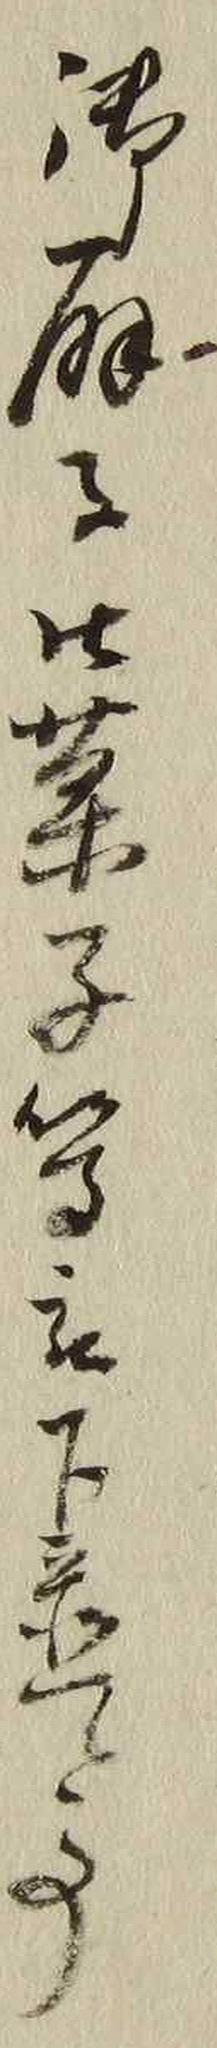御扇子御菓子等被下置候事
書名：諸士系譜　巻之355　す之部5
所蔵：会津若松市立会津図書館
